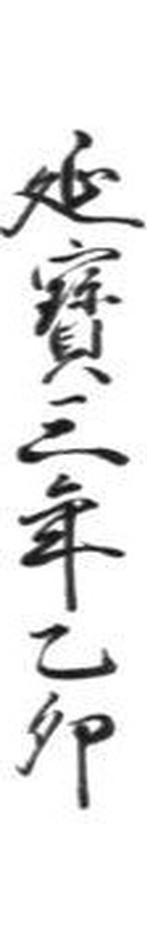延宝三年乙卯
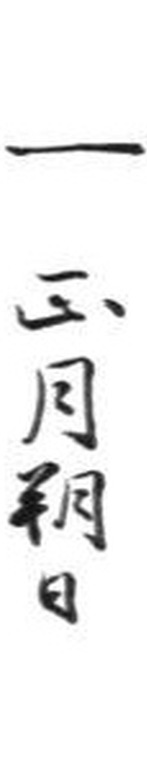一正月朔日
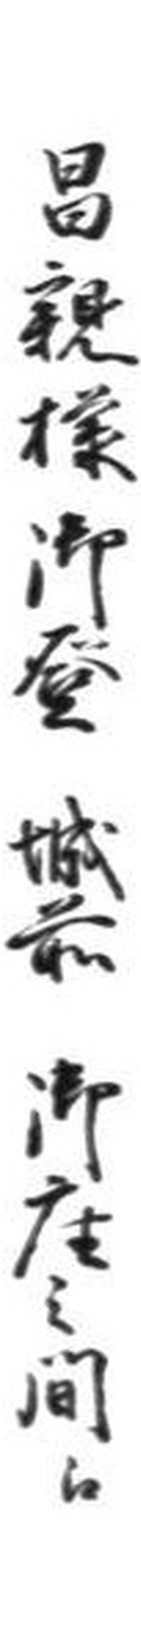昌親様御登城前御座之間江
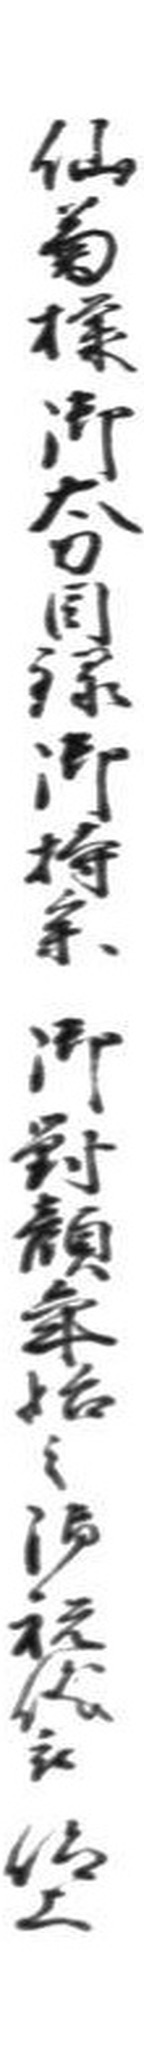仙菊様御太刀目録御持参御対顔年始之御祝儀被仰上
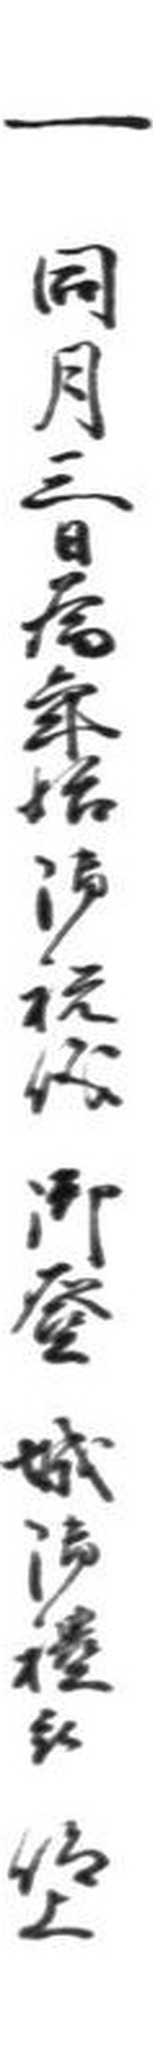一同月三日為年始御祝儀御登城御礼仰上
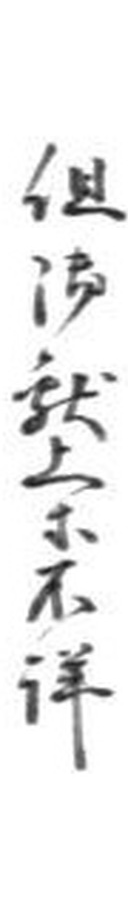但御献上等不詳
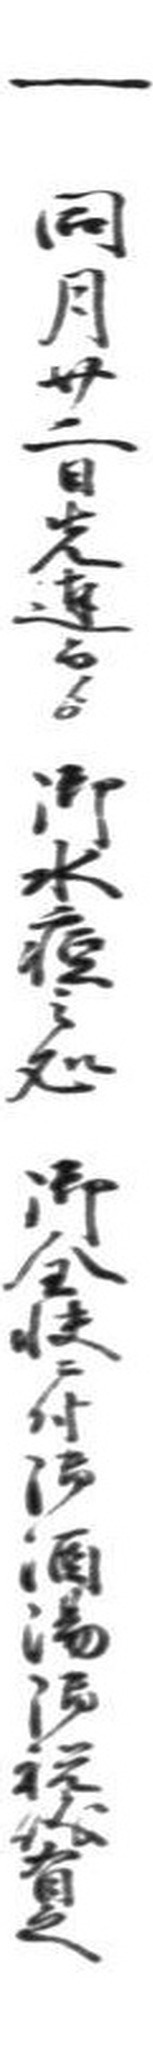一同月廿二日先達而ゟ御水痘之処御全快ニ付御酒湯御祝儀有之
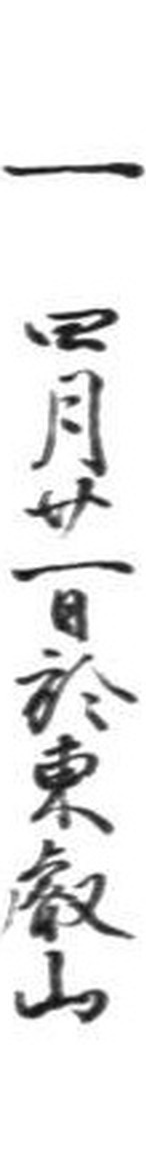一四月廿一日於東叡山
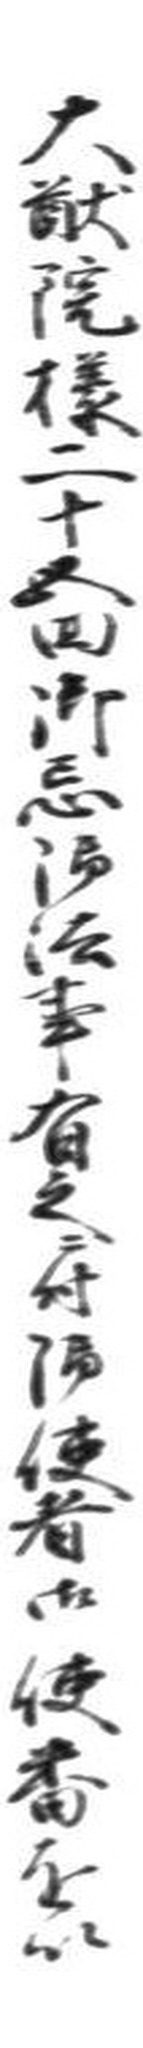大猷院様二十五回御忌御法事有之ニ付御使者御使番を以

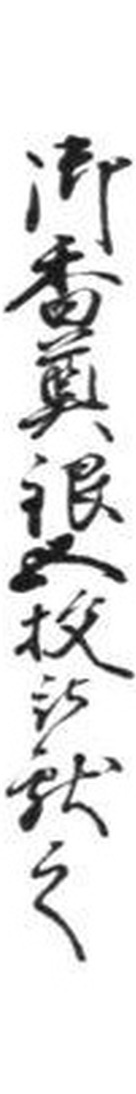御香奠銀五枚被献之
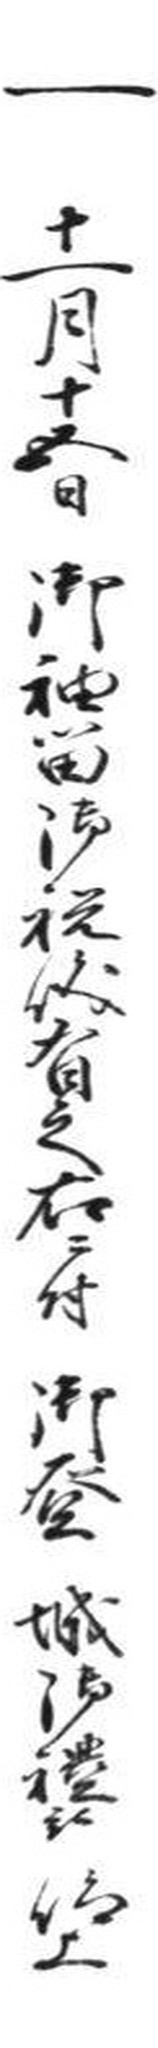一十一月十五日御袖留御祝儀有之右ニ付御登城御礼被仰上
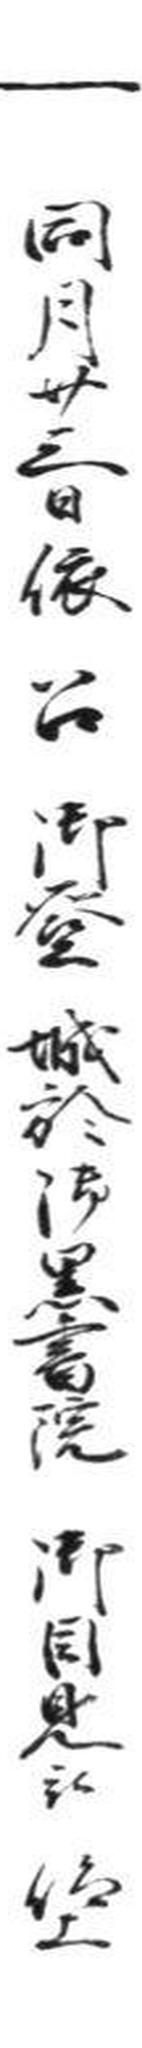一同月廿三日依召御登城於御黒書院御目見被仰上
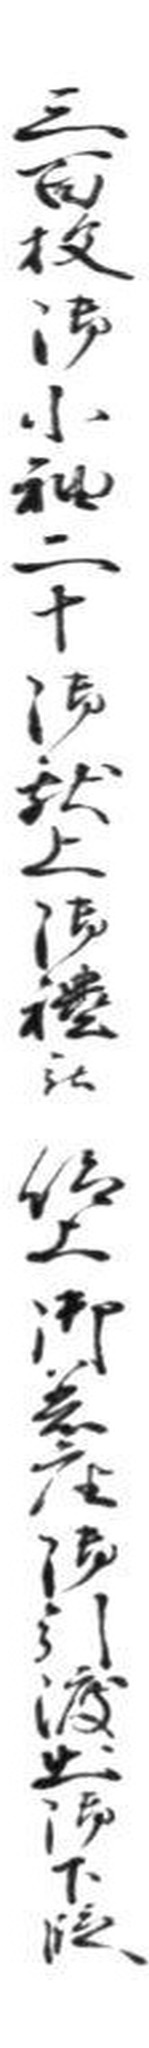三百枚御小袖二十御献上御礼被仰上御着座御引渡出御下段
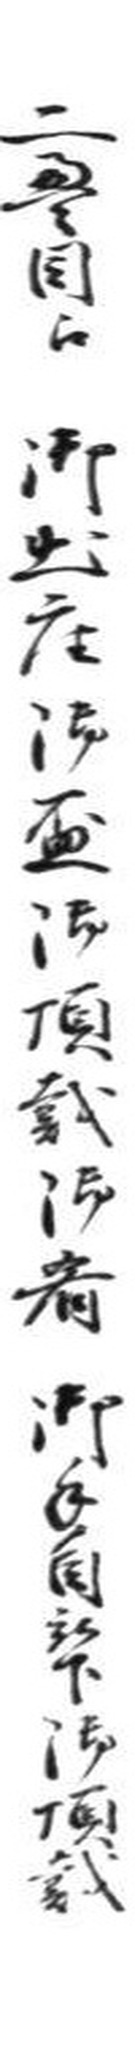ニ畳目江御出座御盃御頂戴御肴御手自被下御頂戴
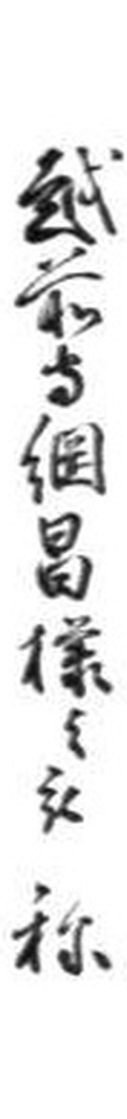越前守綱昌様と被称
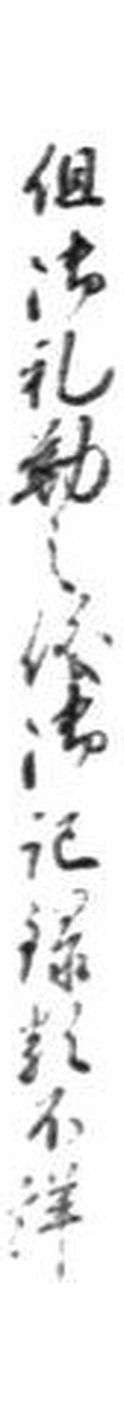但御礼勤之儀御記録類不詳
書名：家譜 十三 綱昌公 従寛文元年到延宝五年
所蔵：福井県文書館 Fukui Prefectural Archives
